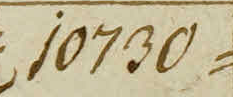10730
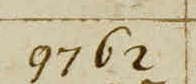9762
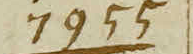7955
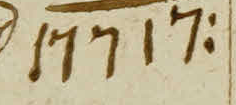17717:
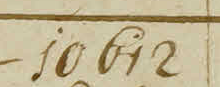10612
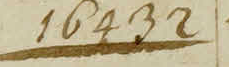16432
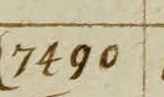7490
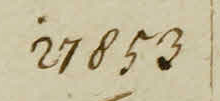27853
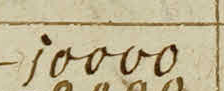10000
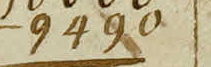9490
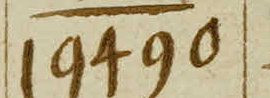19490
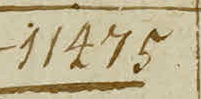11475
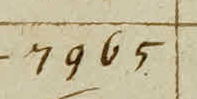7965
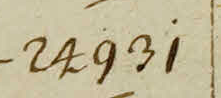24931
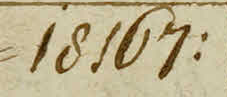18167:
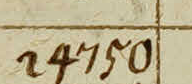24750
